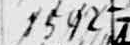1592
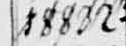18832
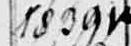1839
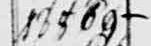13569
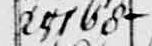25168
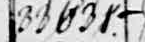33631
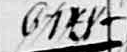6141
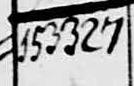153327
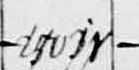25031
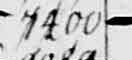7400
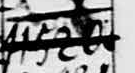41520
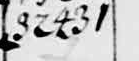32431
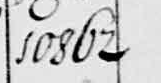10862
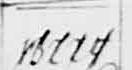16225
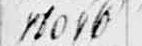13016
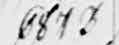6873
